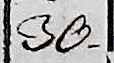30
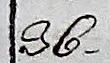36
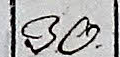30
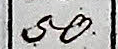50.
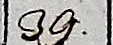39.
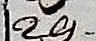29
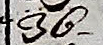36
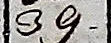39
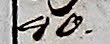40
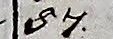57.
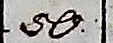50.
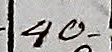40
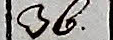36.
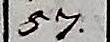57.
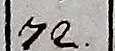72.
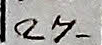27
